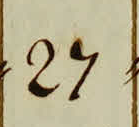27
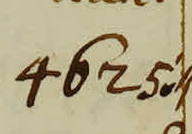4625
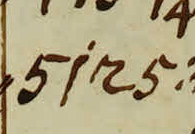5125
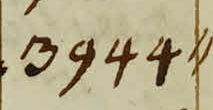3944
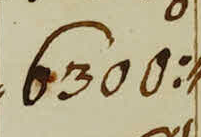6300
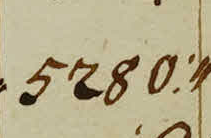5280.
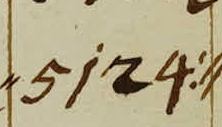5124
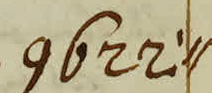9622:
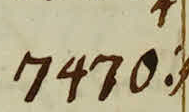7470
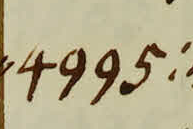4995
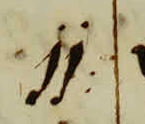11:
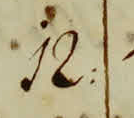12:
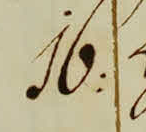16:
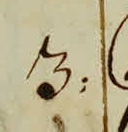3:
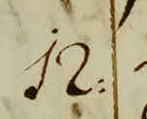12:
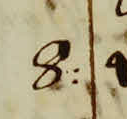8:
